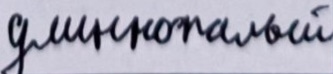длиннопалый
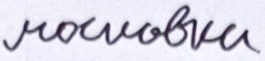московка
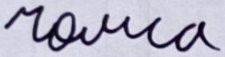чомга
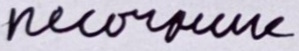песочник
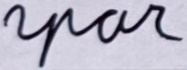грач
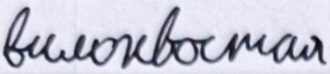вилохвостая
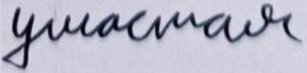ушастая
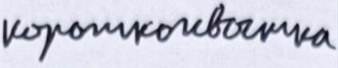короткохвостка
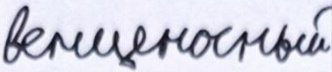венценосный
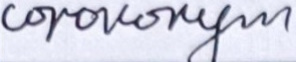сорокопут
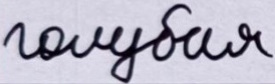голубая
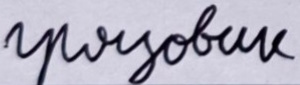грязовик
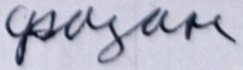фазан
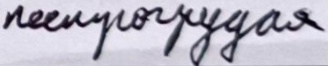пестрогрудая
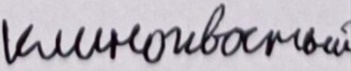клинохвостый
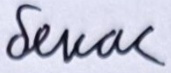бекас
